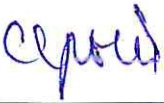серый
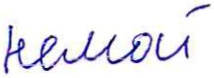немой
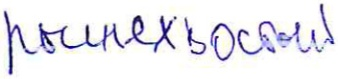рыжехвостый
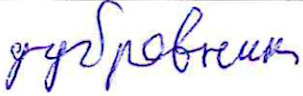дубровник
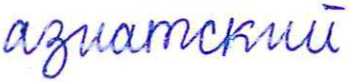азиатский
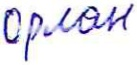орлан
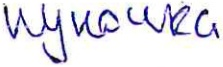пуночка
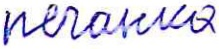пеганка
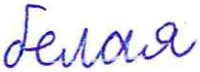белая
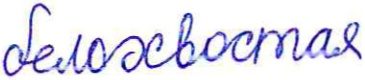белохвостая
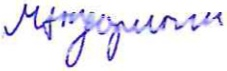мэндоринш
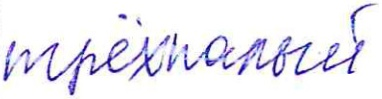трёхпалый
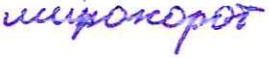широкорот
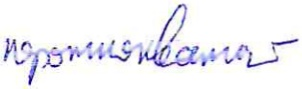короткохватой
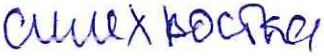синехвостка
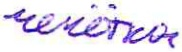чечётка
